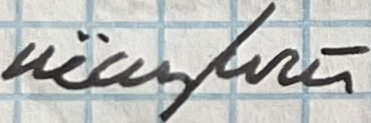пёстрый
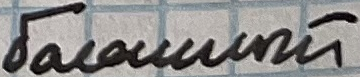болотный
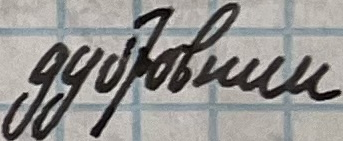дубровник
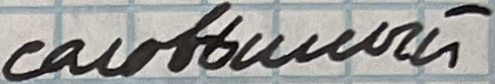соловьиный
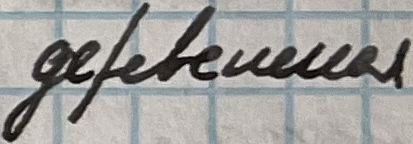деревенская
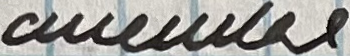степная
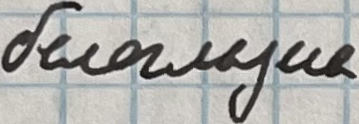белоглазка
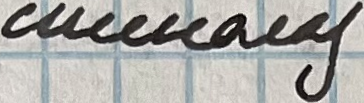стенолаз
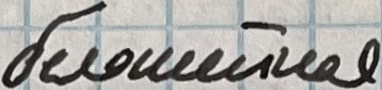белошейная
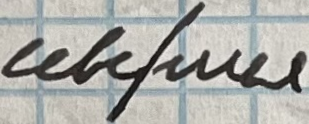северная
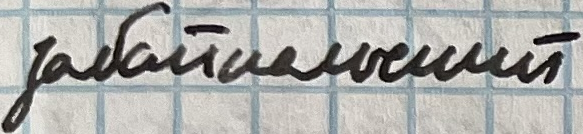забайкальский
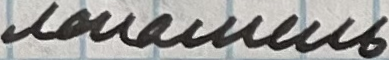лопатень
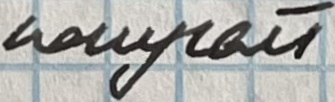попугай
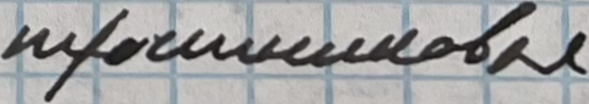тростниковая
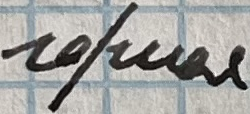горная
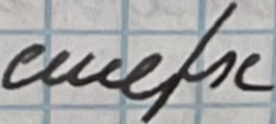стерх
